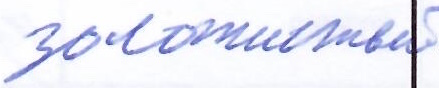золотистый
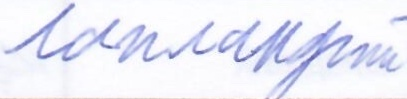лапландсий
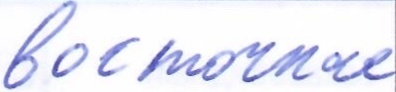восточная
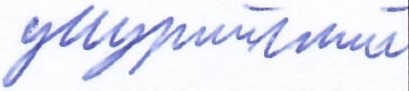уссурийский
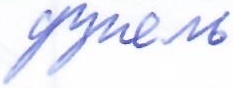дупель
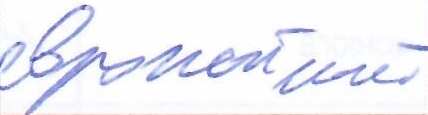европейшй
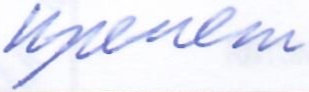кречет
